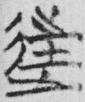○（往）
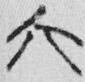六
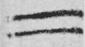二
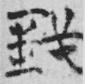○（執）
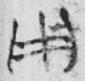用
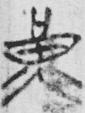黃
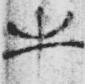牛
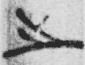之
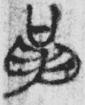革
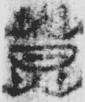莫
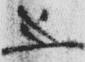之
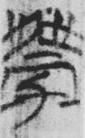○（勝）
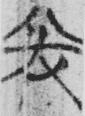○（敚○）
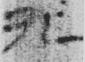九
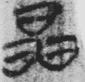晶
